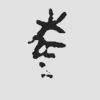蒼
